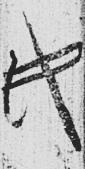女（如）
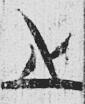之
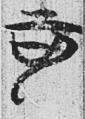可（何）
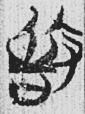{告攴}（曹）
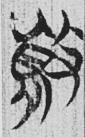{艸目勿攴}（沫）
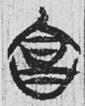合
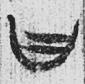曰
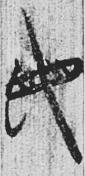母
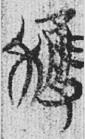○（獲）
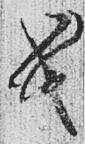民
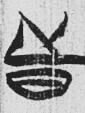○（時）
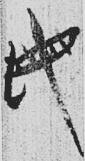母
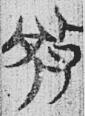敓（奪）
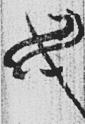民
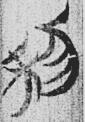利
